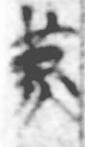黃
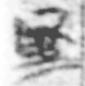爲
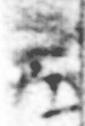○（左）
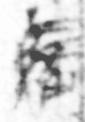○（服）
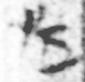○（左）
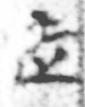徒
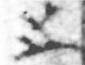之
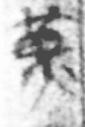黃
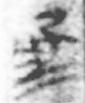爲
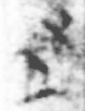○（右）
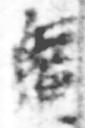○（服）
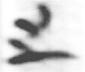之
